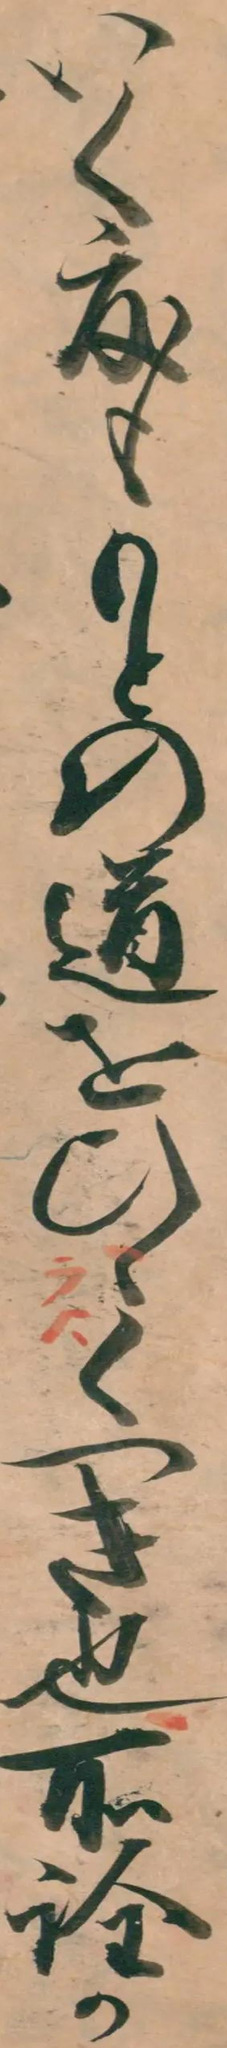いく度ももとの道をひくくへき也所詮か
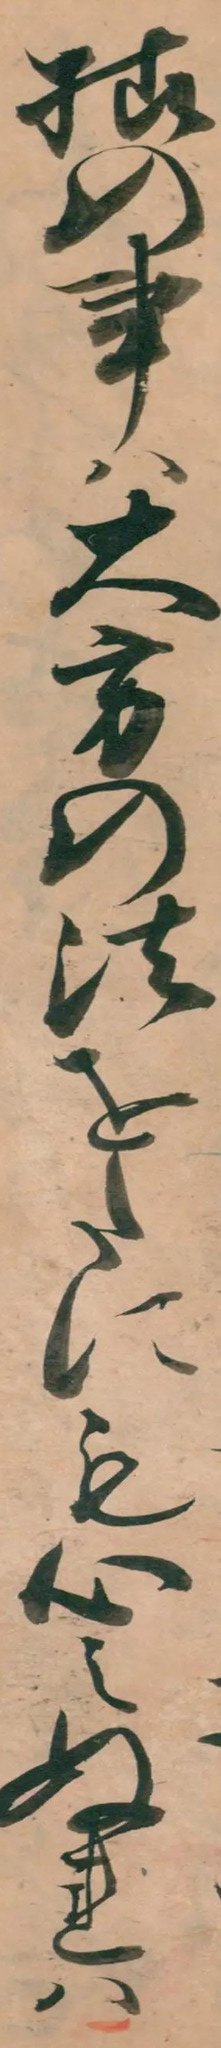様の事ハ大方の法をたにも心えぬれハ
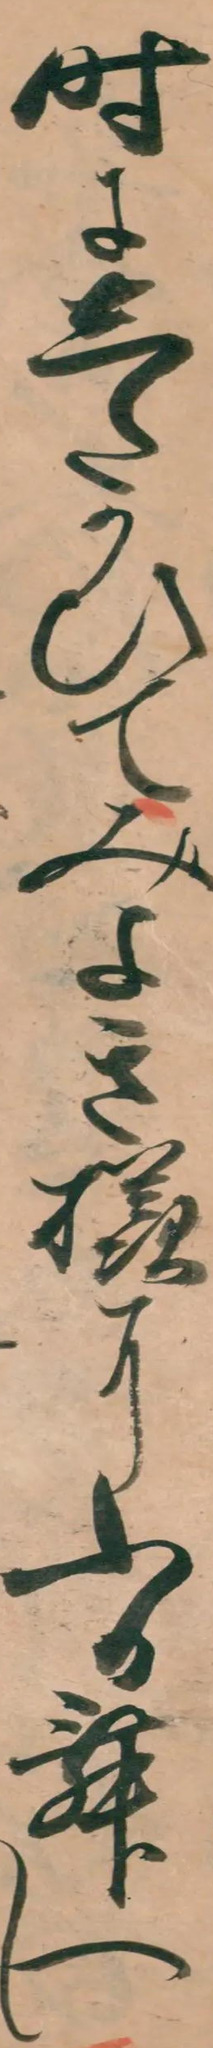時にしたかひてみよき様にふる舞へし
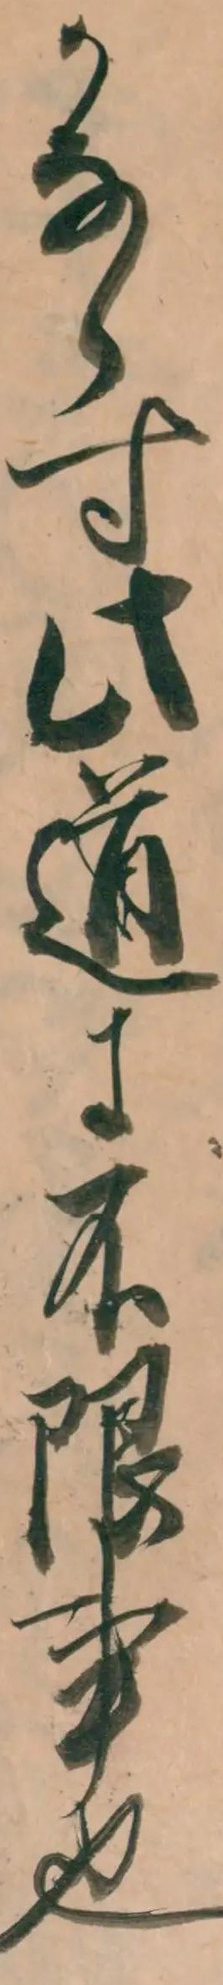かならす此道に不限事也
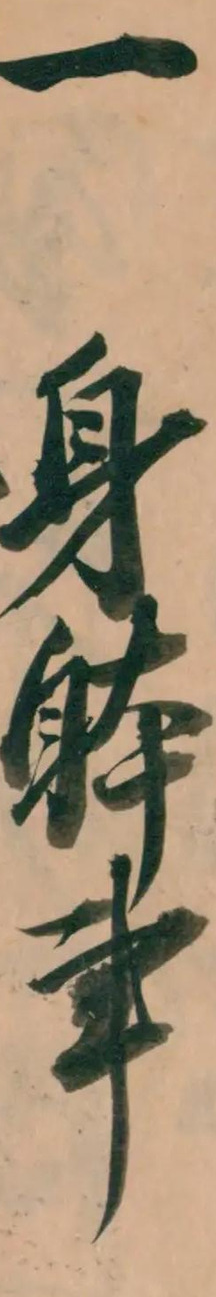一身体事
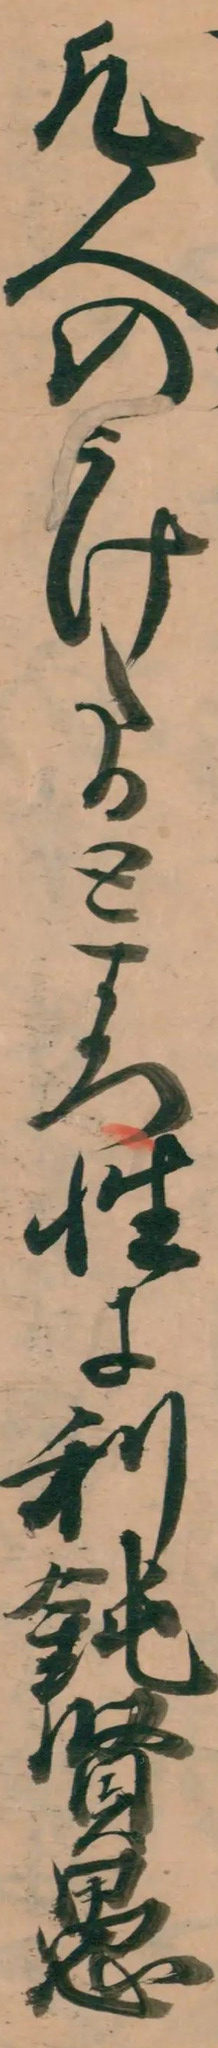凡人のうけたるところ性に利鈍賢愚
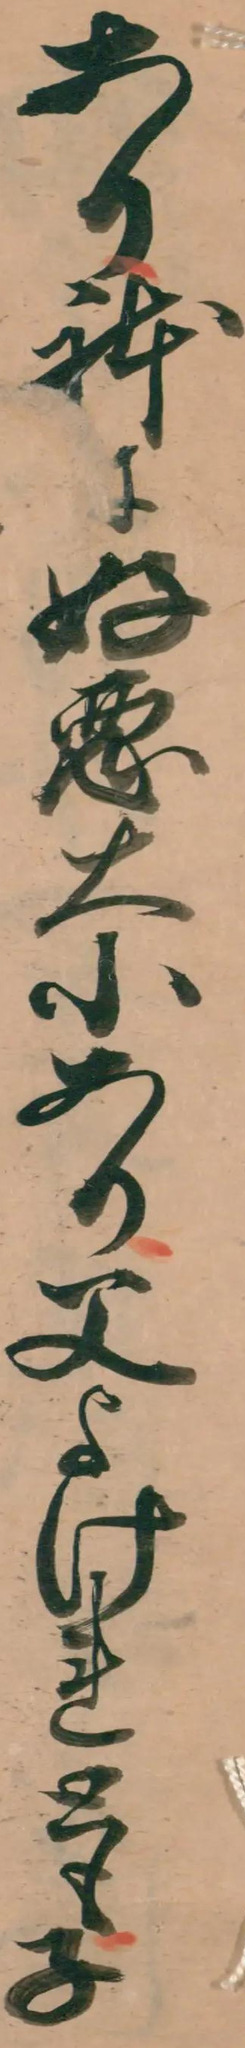あり体に好悪大小あり父よけれとも子
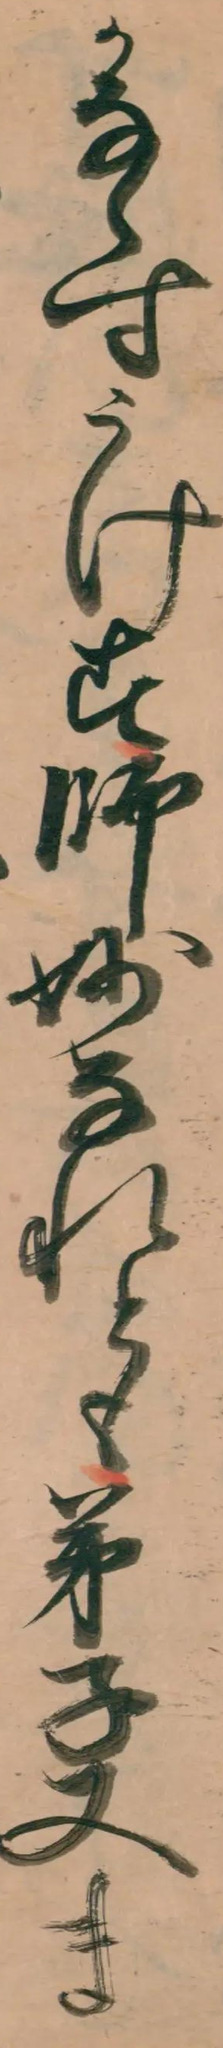かならすうけす師妙なれとも弟子又ま
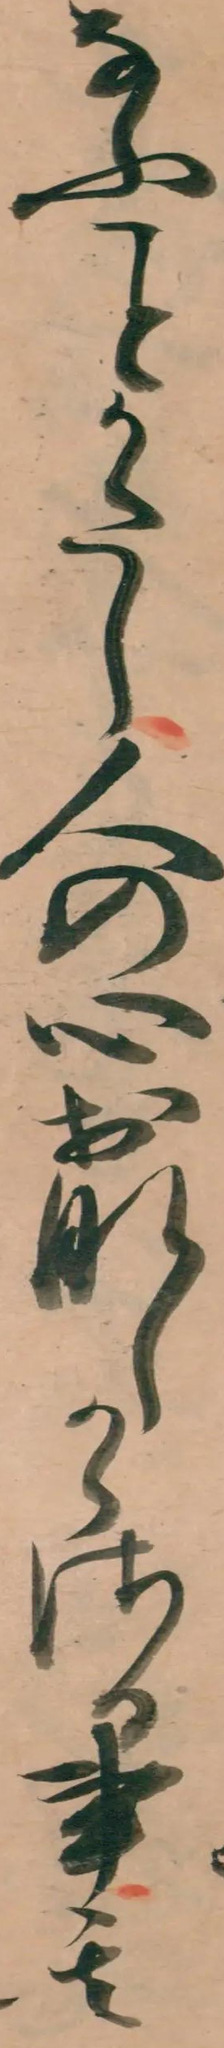なふことかたし人の心おなしからさる事其
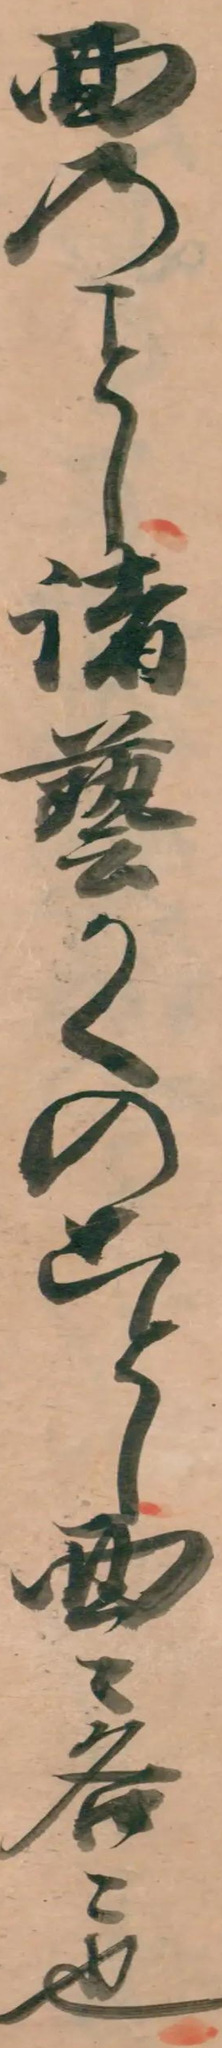面のことし諸芸かくのことし面々各々なり
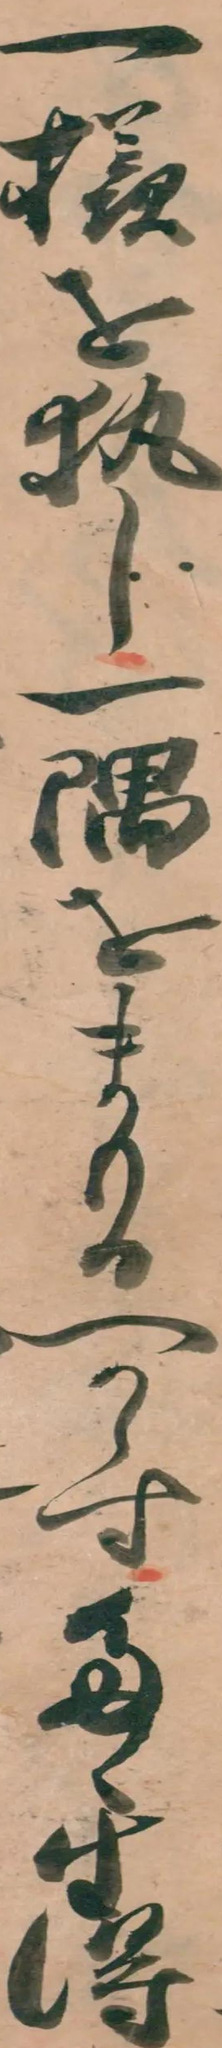一様を執し一隅をまもるへからすたゝ生得
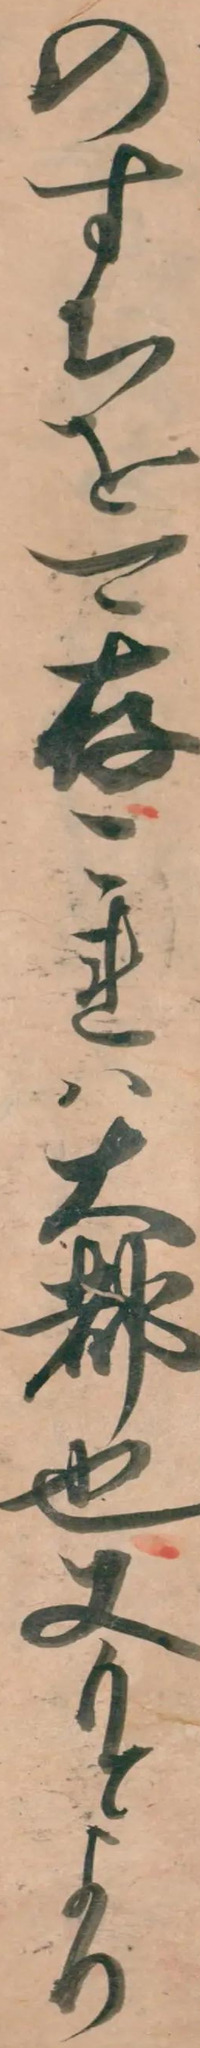のすちを可存これハ大都也又もとより
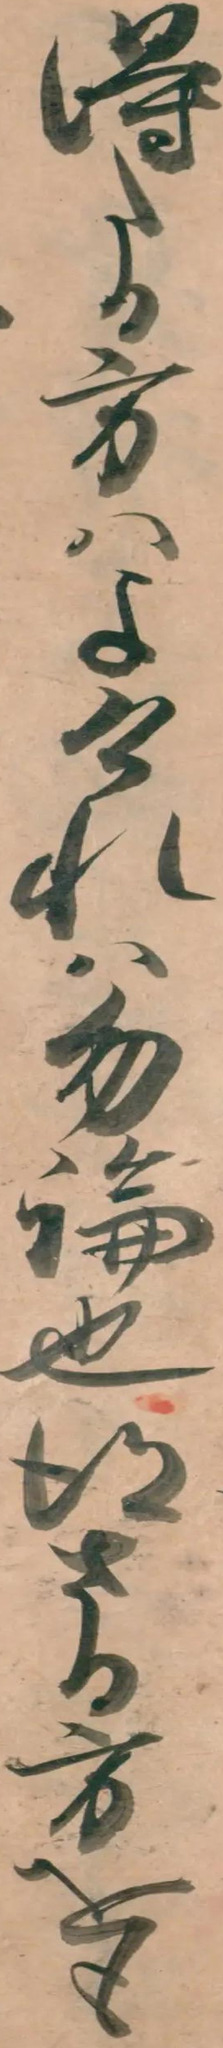得たる方ハよけれハ勿論也得さる方をも
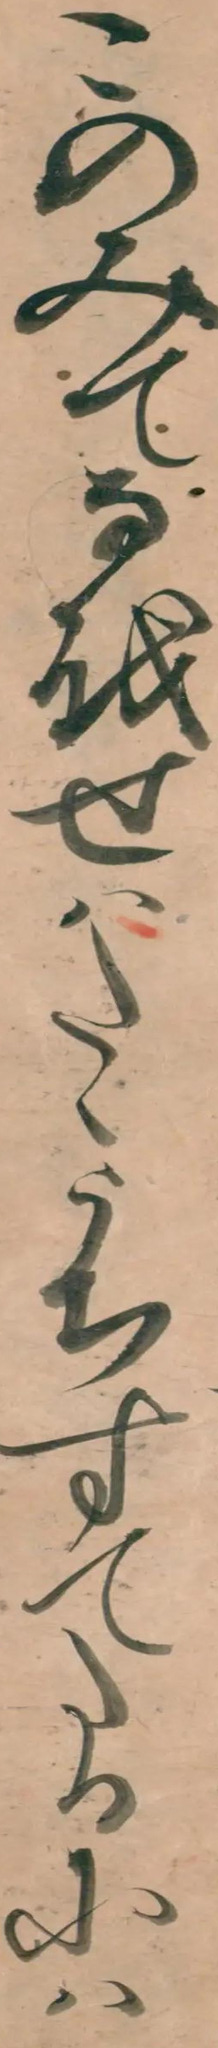このみてなをせハたゝうちすてたるにハ
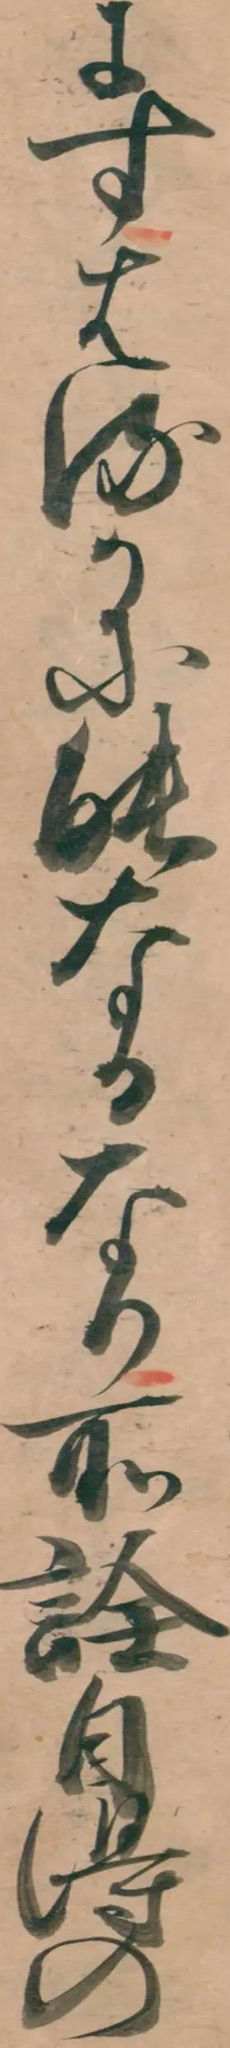にすはるかに能なるなり所詮自得の

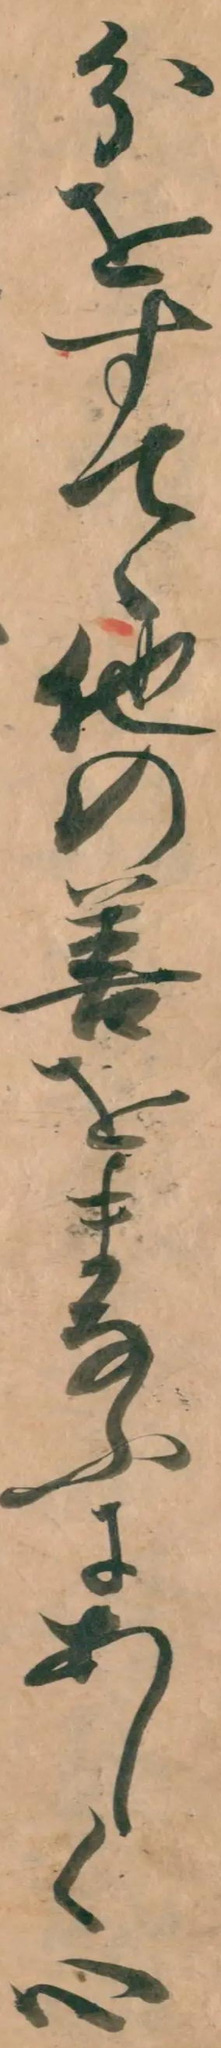分をすてゝ他の善をまなふにあしく心
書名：蹴鞠之条々大概
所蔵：国立国会図書館 National Diet Library, JAPAN
